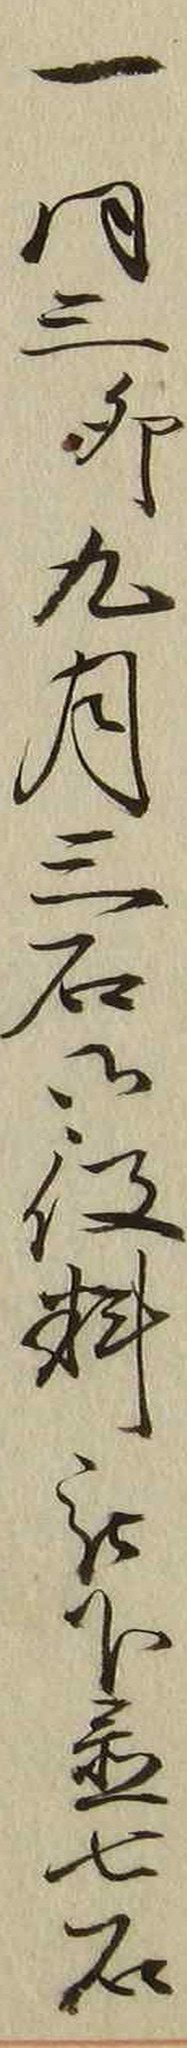一同三卯九月三石御役料被下置七石
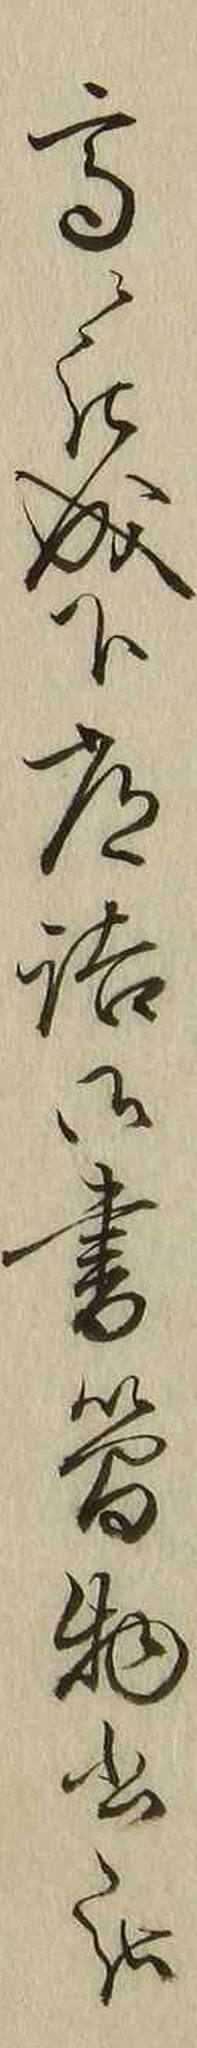高ニ被成下常詰御書簡物書被
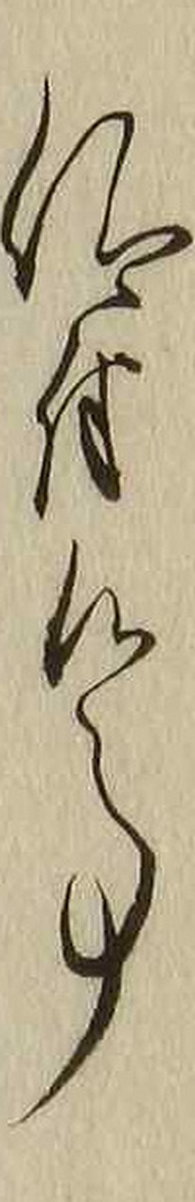仰付候事
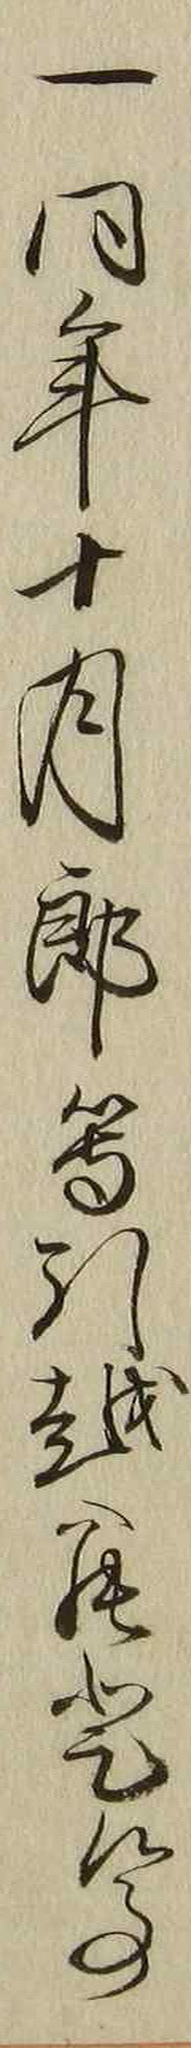一同年十月郎等引越へ罷登候事
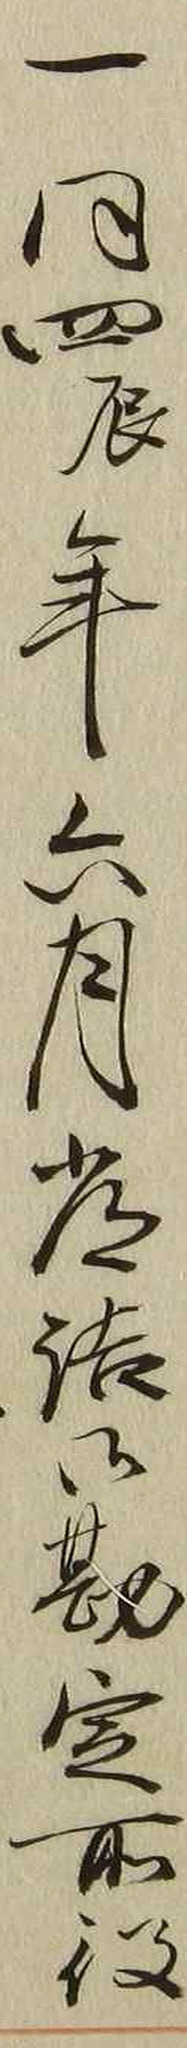一同四辰年六月常詰御勘定所役
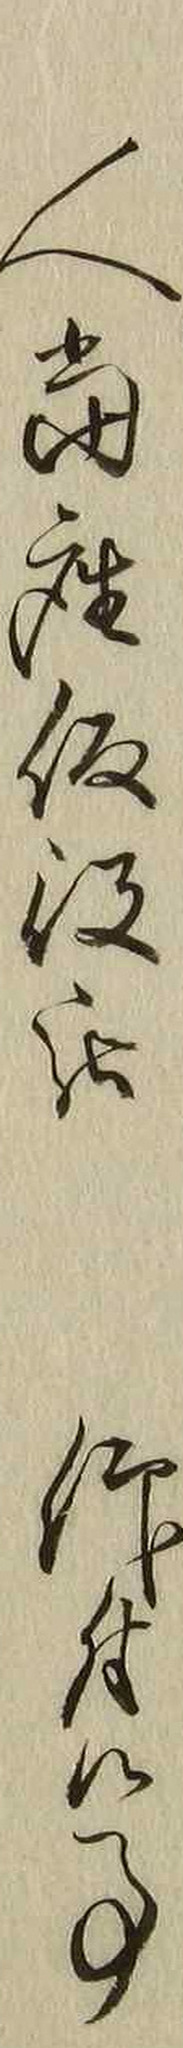人当座仮役被仰付候事
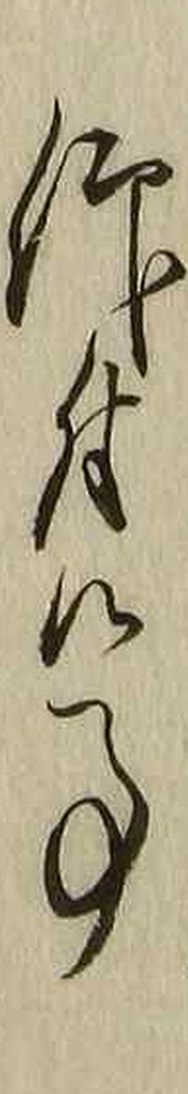仰付候事
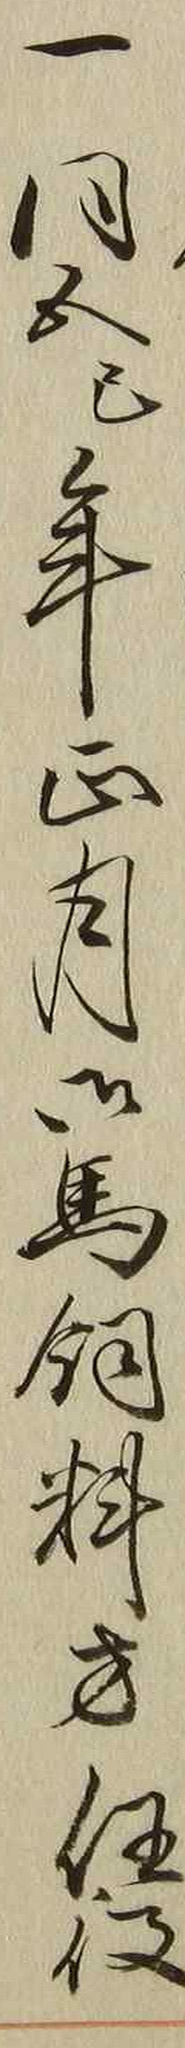一同五巳年正月御馬飼料方任役
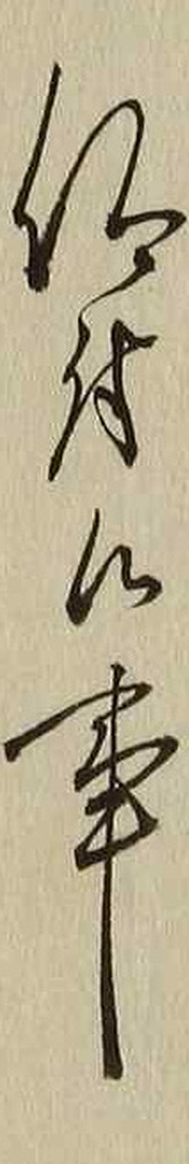仰付候事
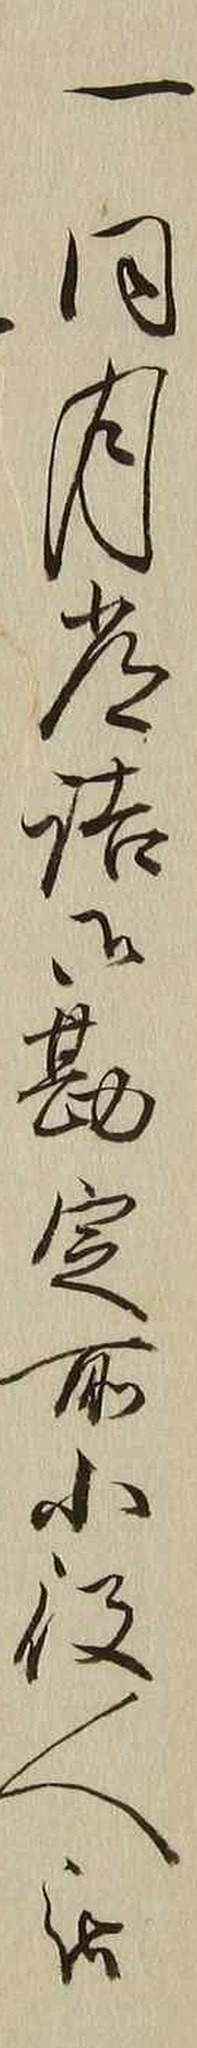一同月常詰御勘定所小役人被
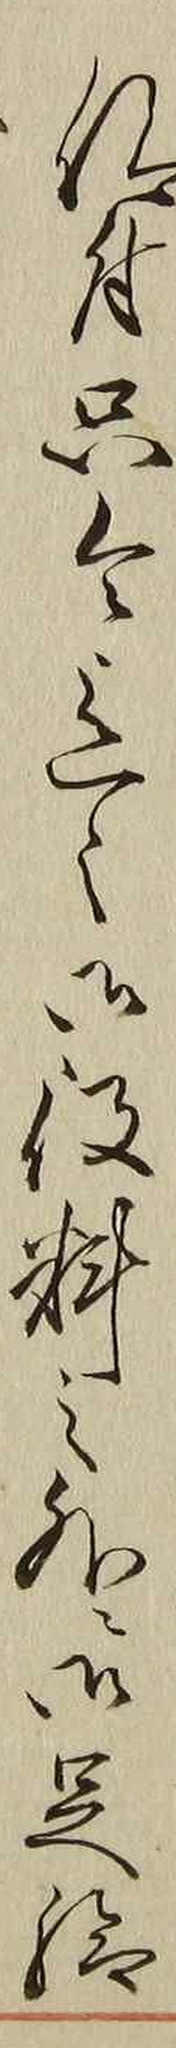仰付只今迄之御役料之外ニ御足給
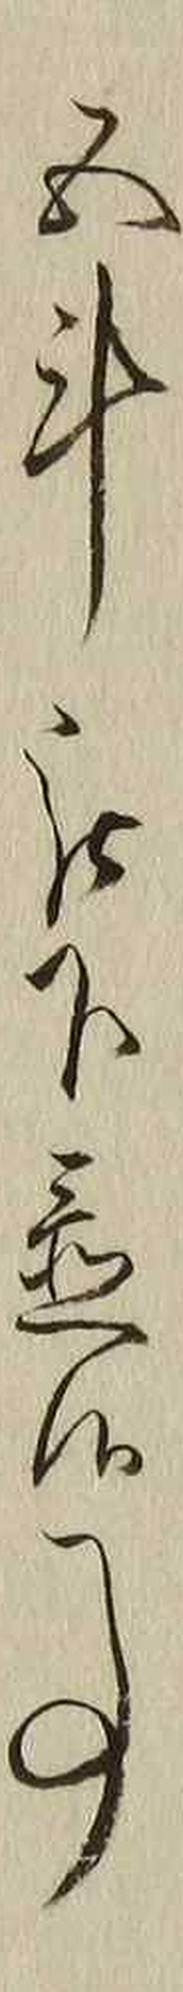五斗被下置候事
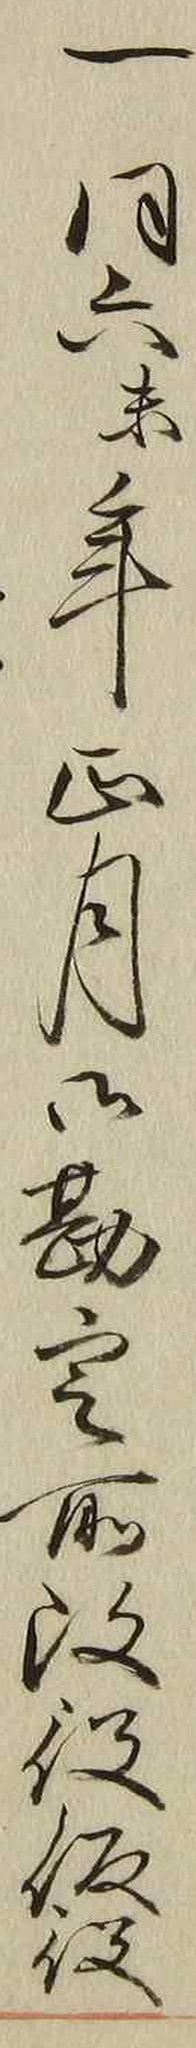一同六未年正月御勘定所改役仮役
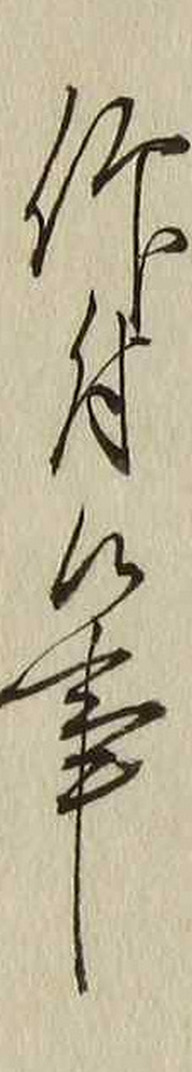仰付候事
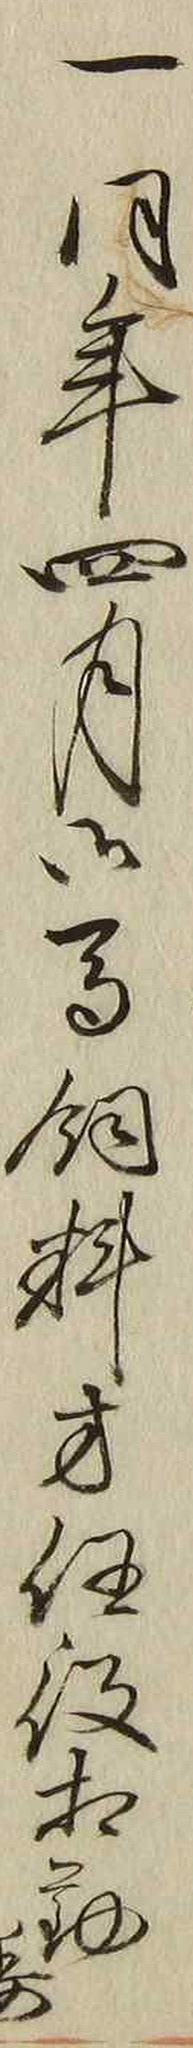一同年四月御馬飼料方任役相勤委
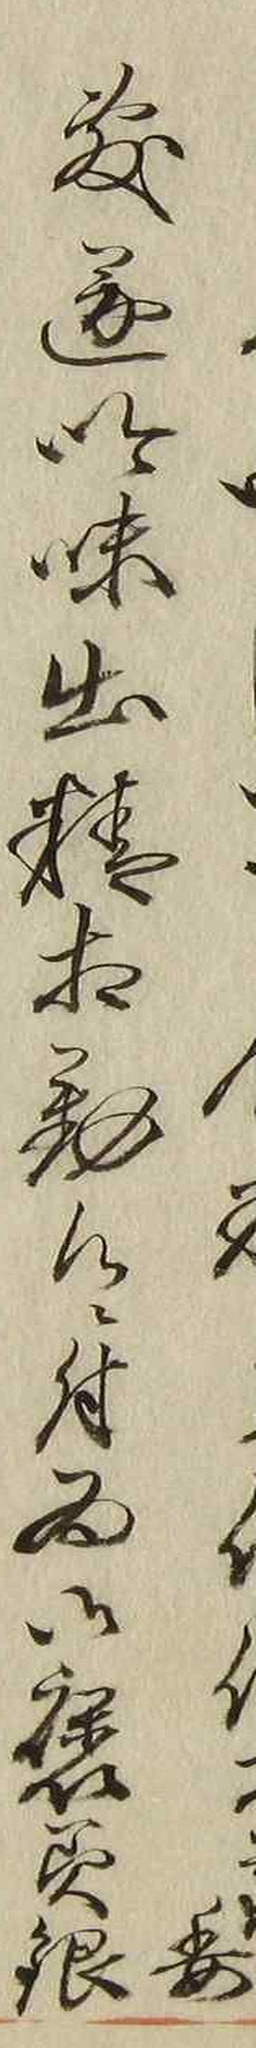敷遂吟味出精相勤候ニ付為御褒美銀
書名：諸士系譜　巻之57　ほ之部4
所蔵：会津若松市立会津図書館
